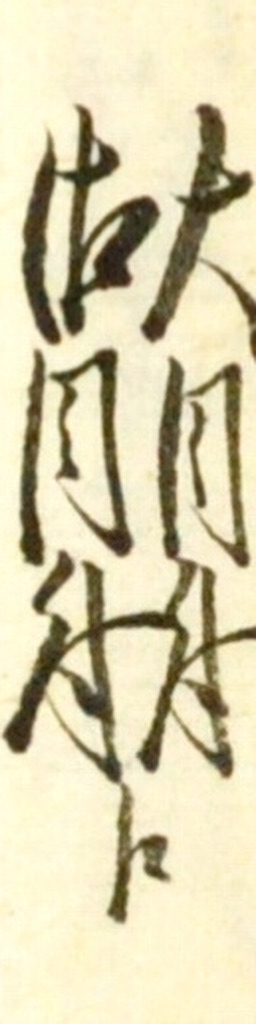御目付江

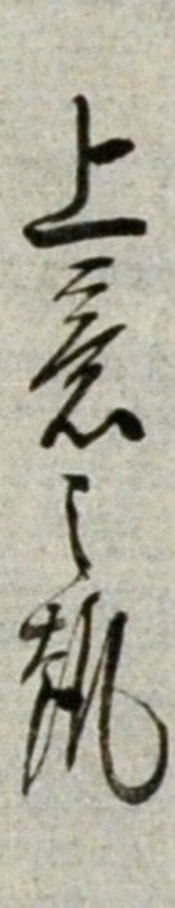上意之趣
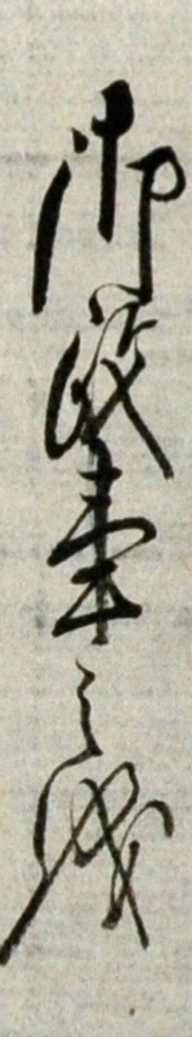御政事之儀
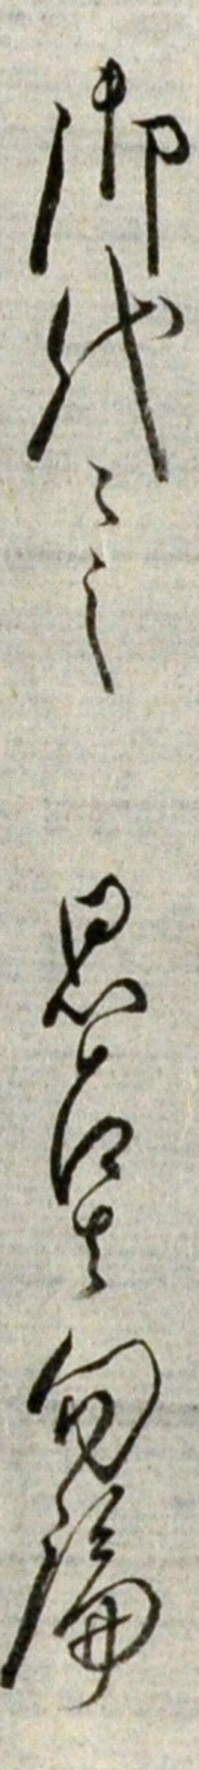御代々之思召者勿論
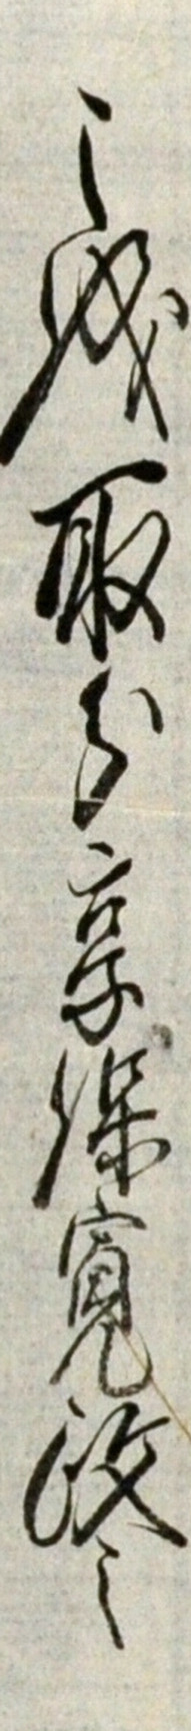之儀取分享保寛政之
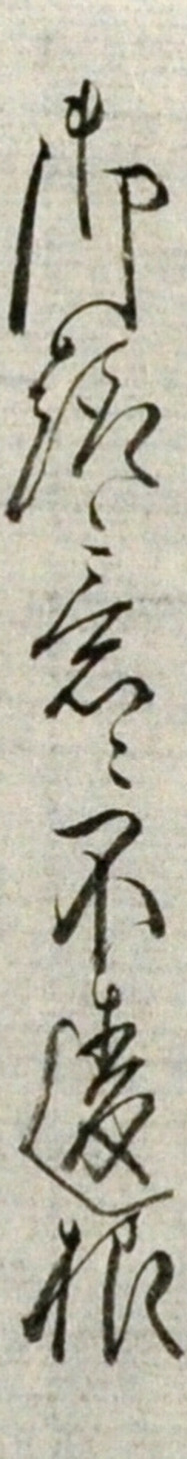御趣意不違根
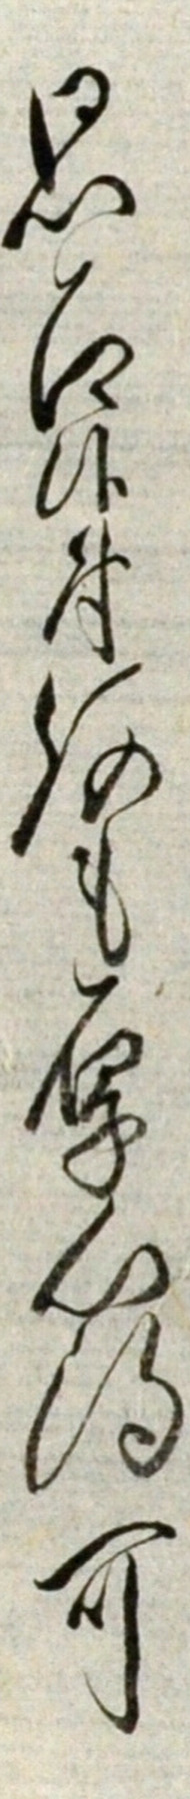思召候付何も厚心得可
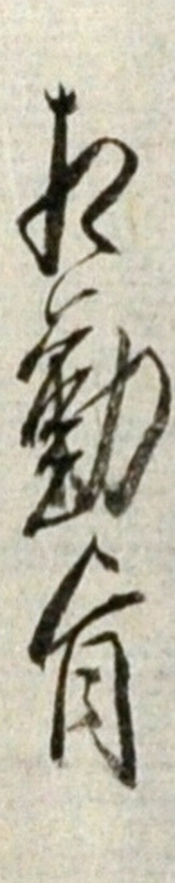相勤旨
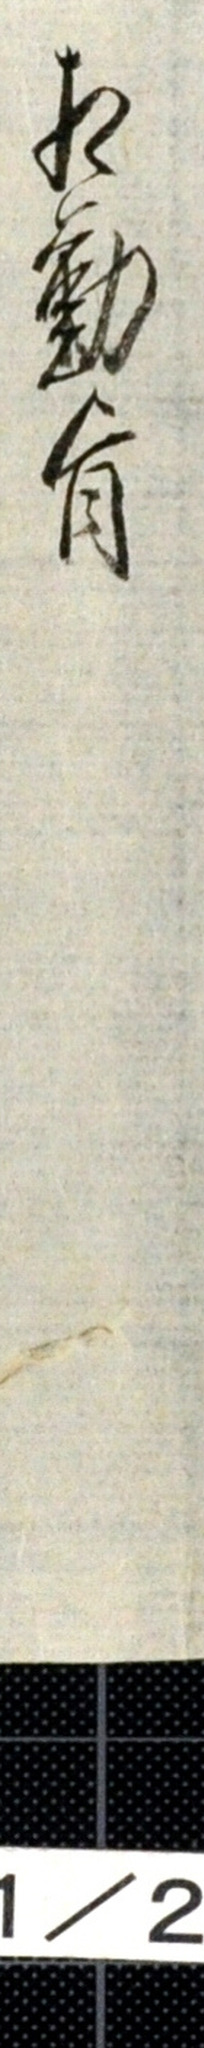相勤旨
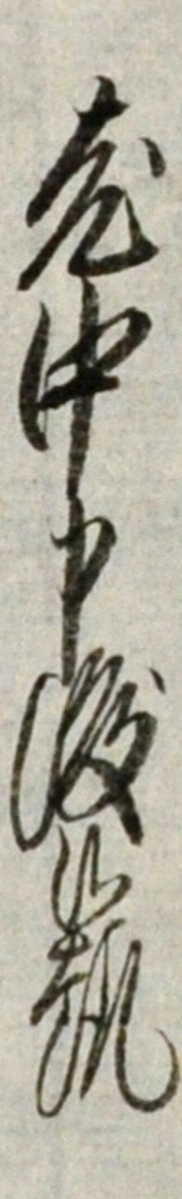老中申渡候趣
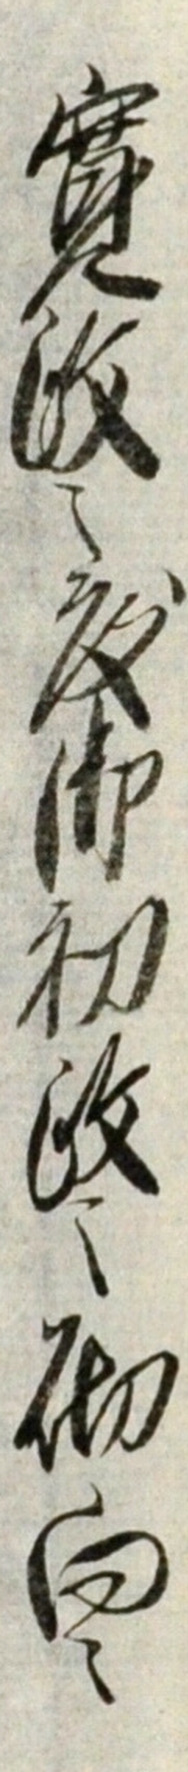寛政之儀御初政之砌向々
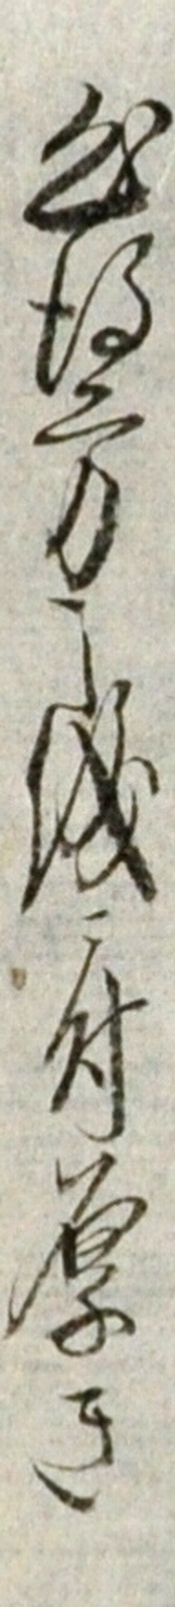心得方之儀付厚き
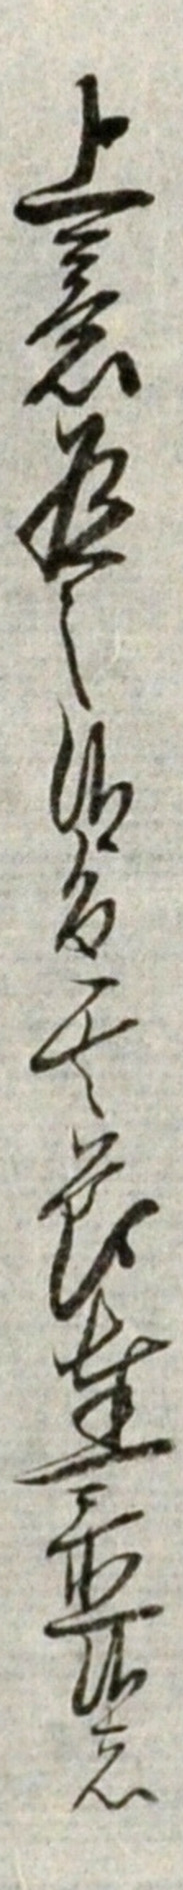上意有之候旨其節達置候者
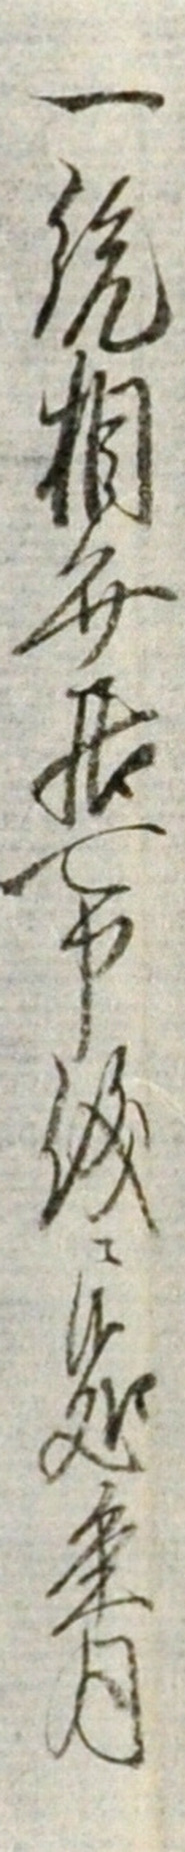一統相弁居可申儀候処秊月
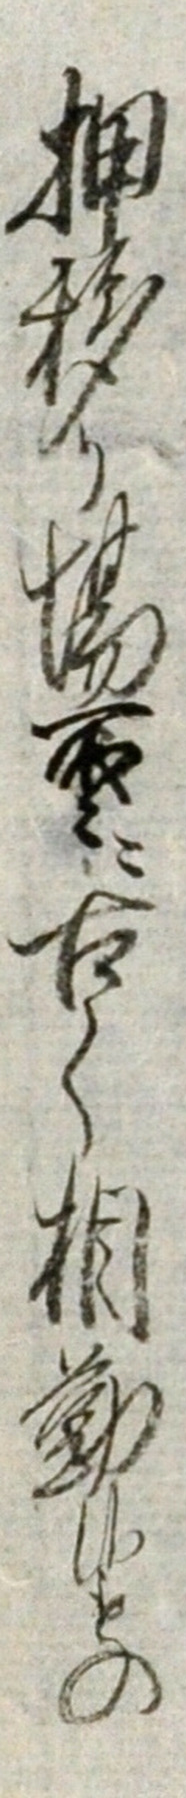押移り場取々古く相勤候もの
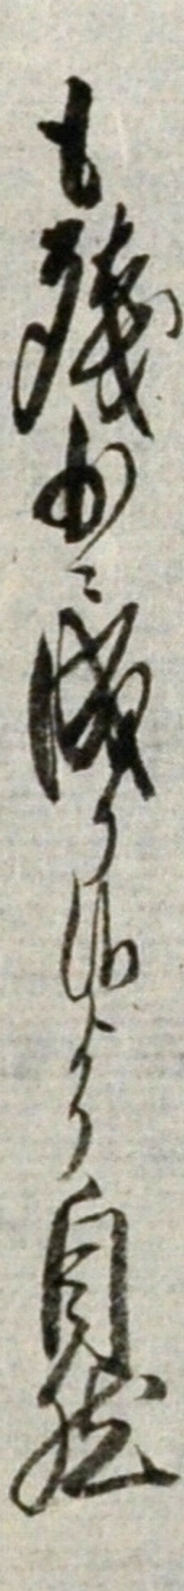も残少ニ成り候より自然
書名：若年寄御役中御調書付
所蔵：伊那市立高遠町図書館・合同会社AMANE
